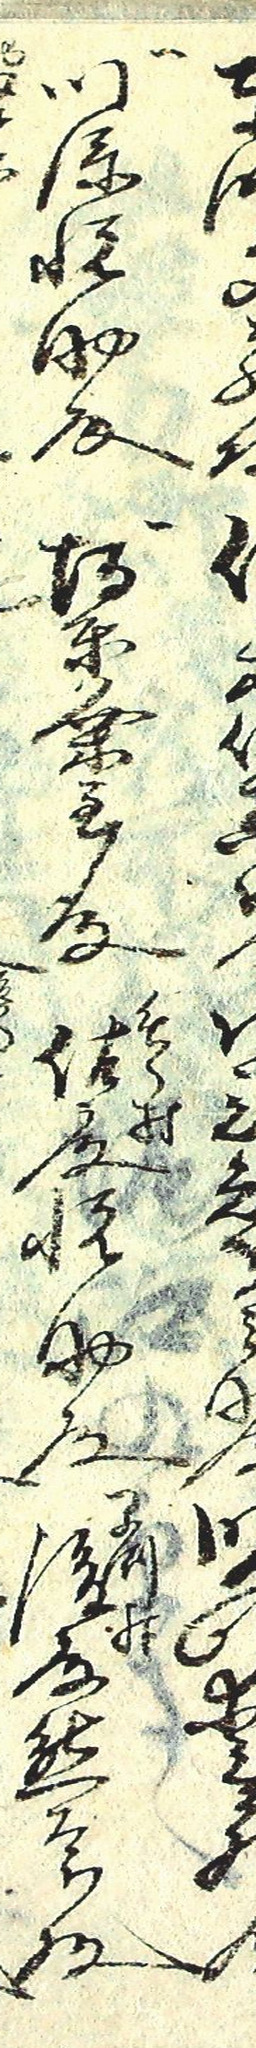川添悦助殿坂東粂蔵殿佐藤悦助殿後藤熊太郎殿
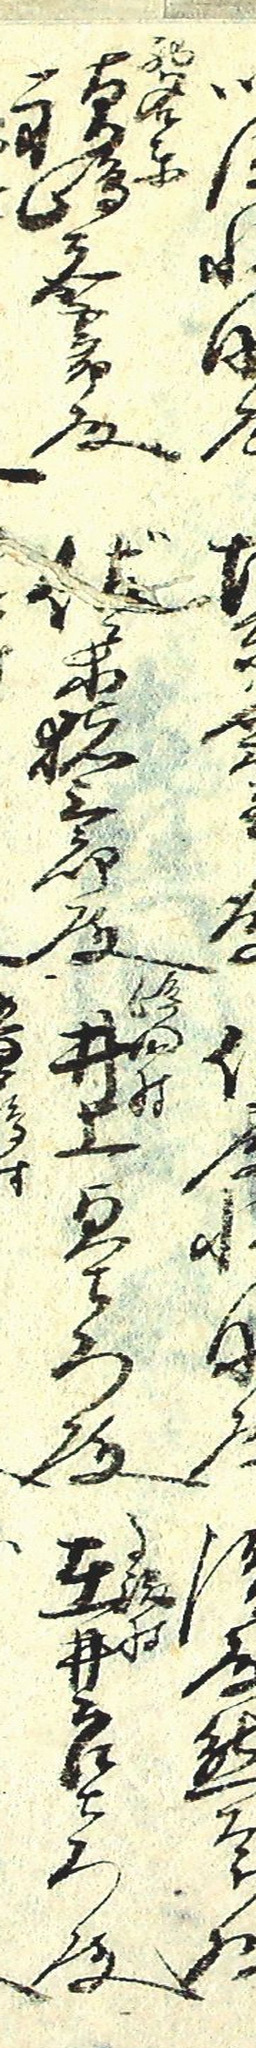禎島嘉五郎殿佐々木猪三郎殿井上貞右衛門殿在井吉右衛門殿
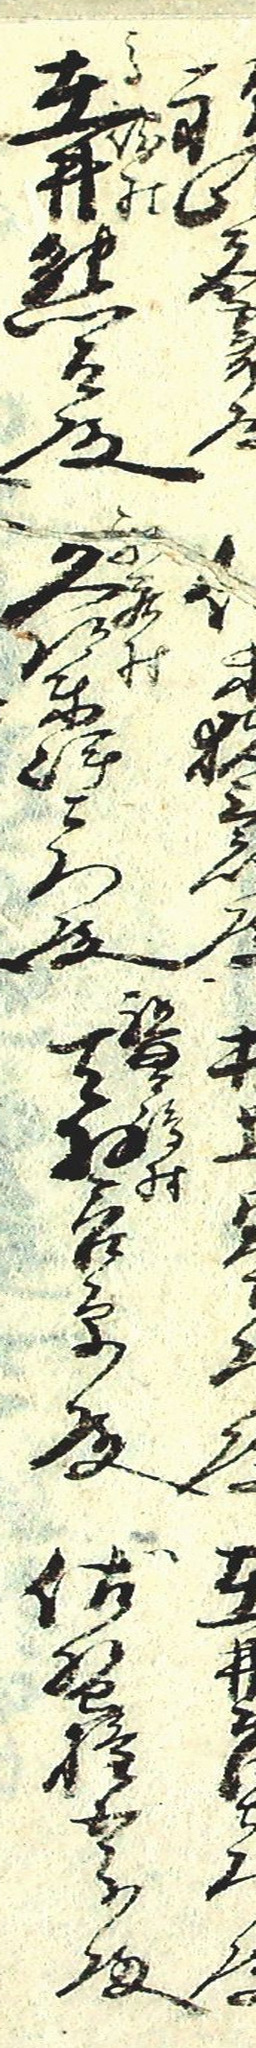在井熊太殿久須米伊右衛門殿天羽善兵衛殿佐野権五郎殿

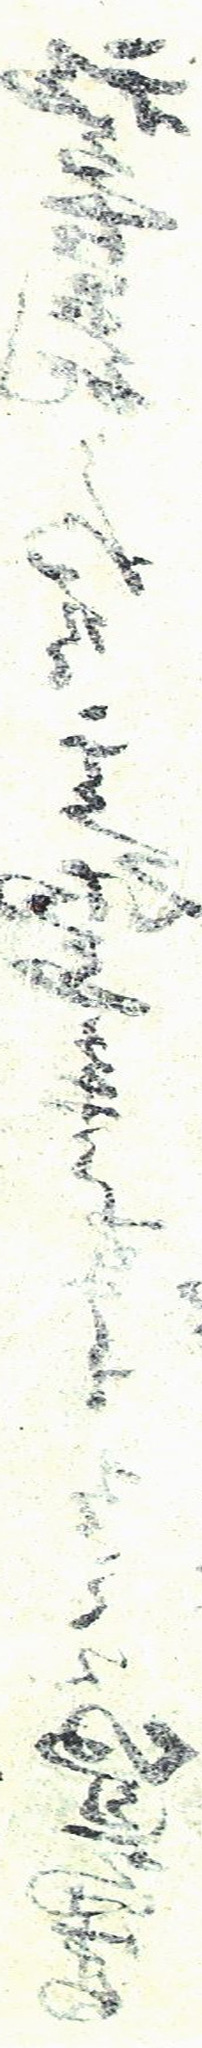三月十一日
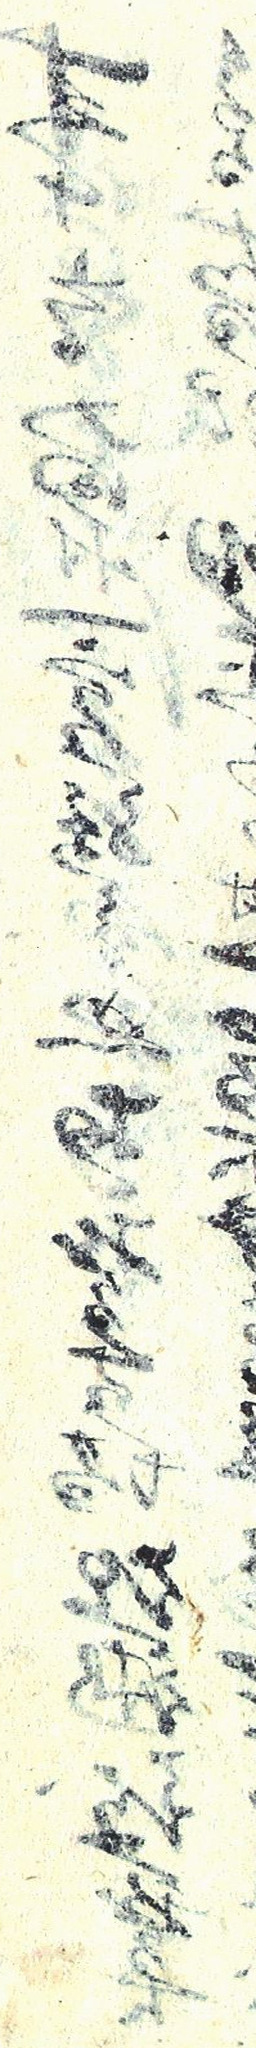三月十一日
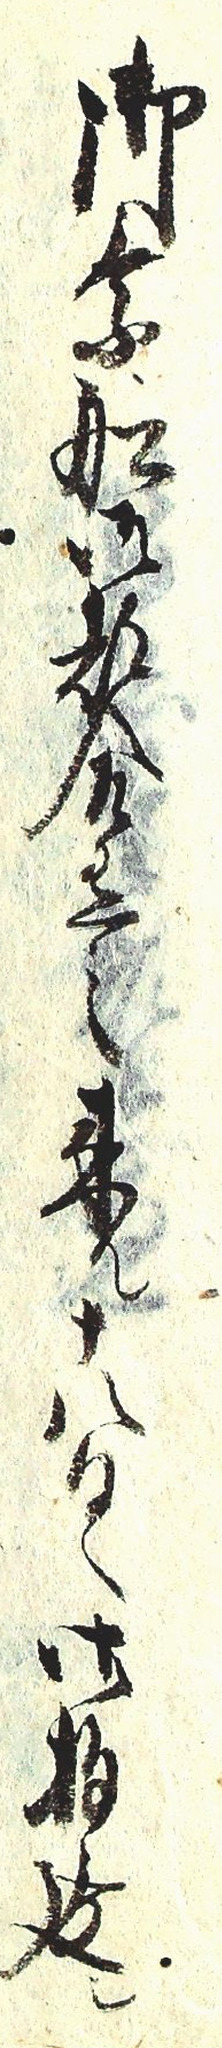御乗船御都合有之来る十八日へ御指延し
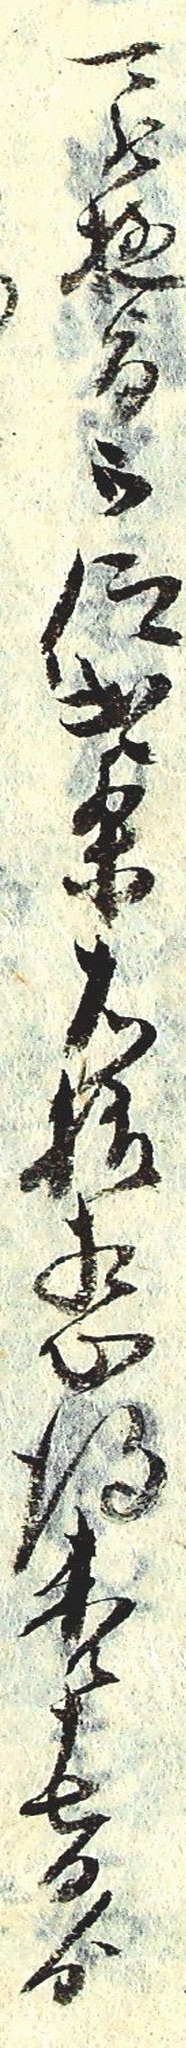可被遊旨被仰遣候条右様相心得来る十七日ゟ
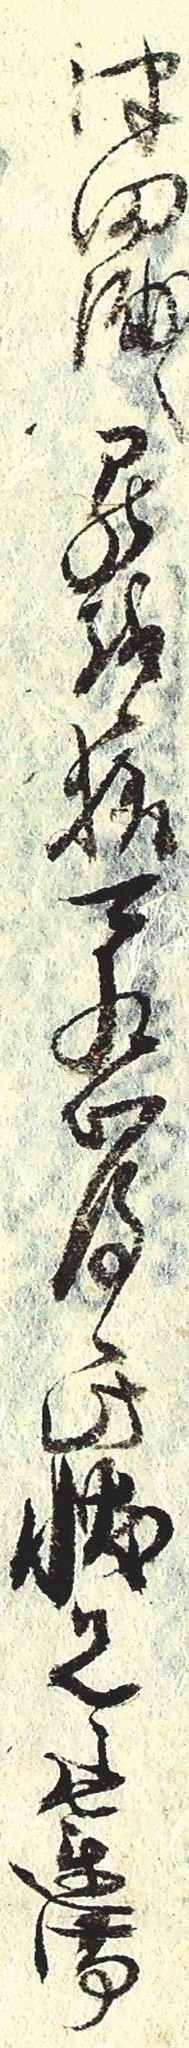津田浦へ罷越候様可相心得候此状先々無遅滞
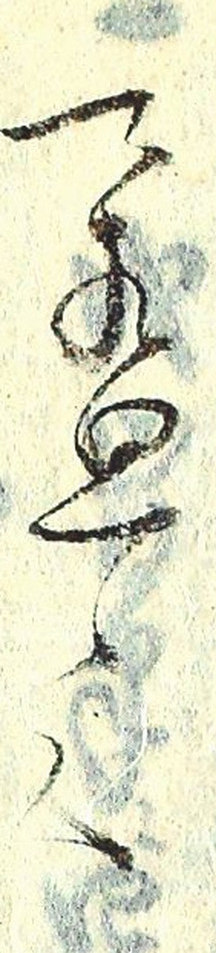可相廻候以上
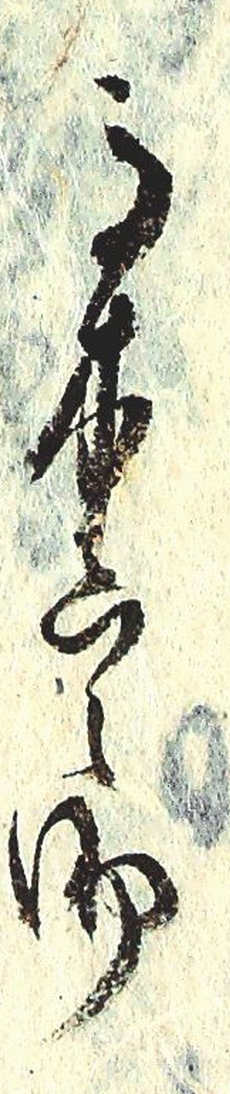高木真之助
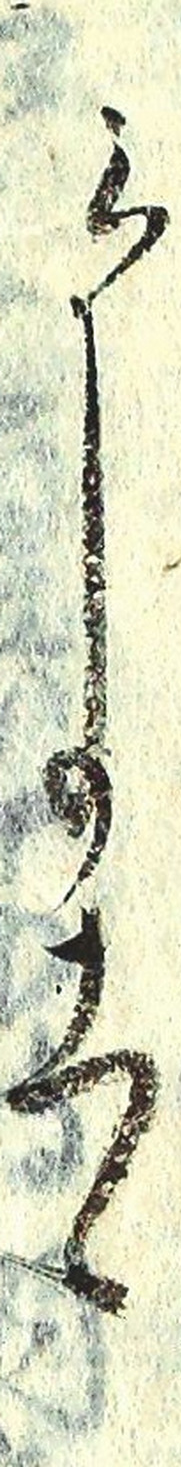三月十一日
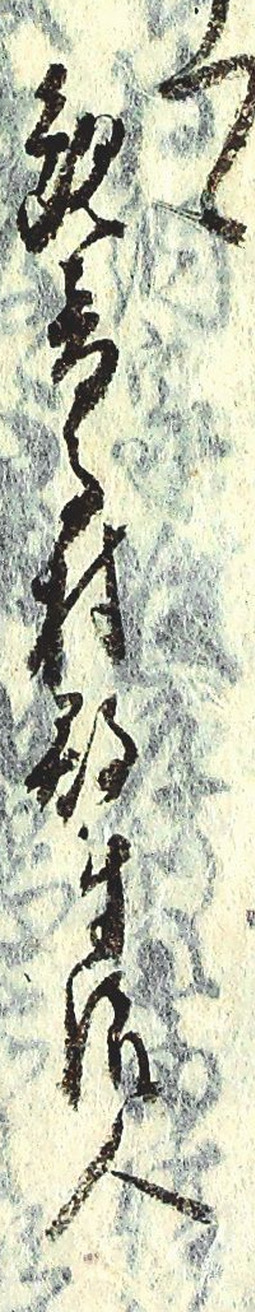観音寺村郡付浪人
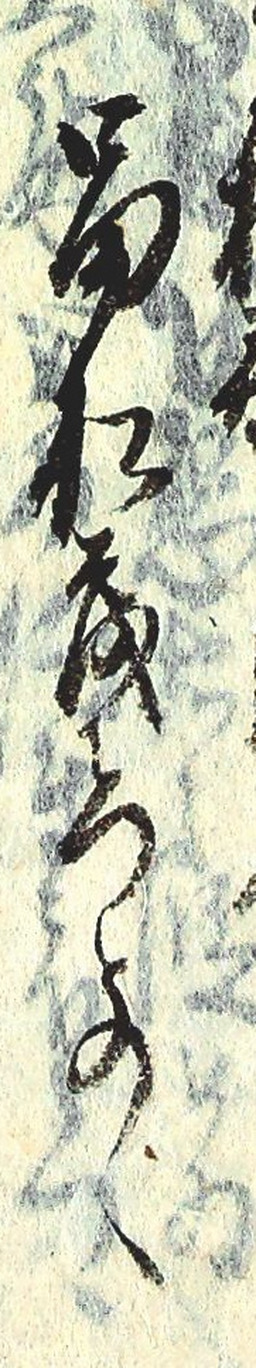冨松茂右衛門とのへ
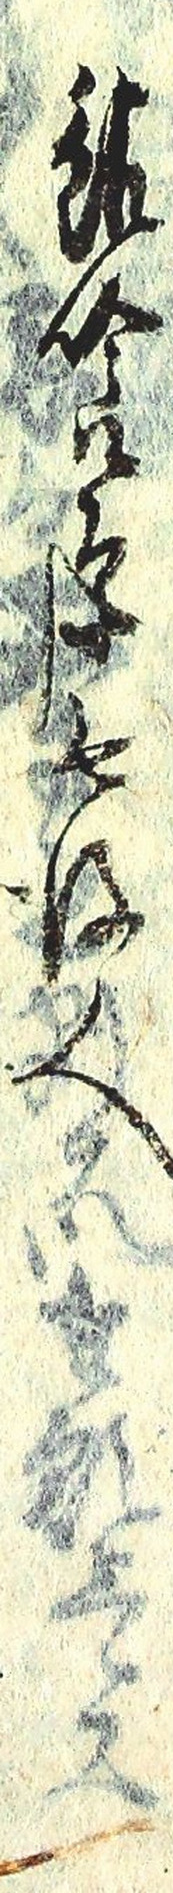鮎喰原無役人
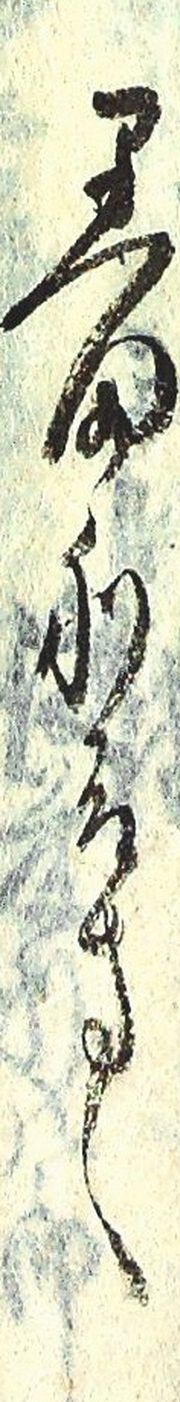黒田利吉方へ
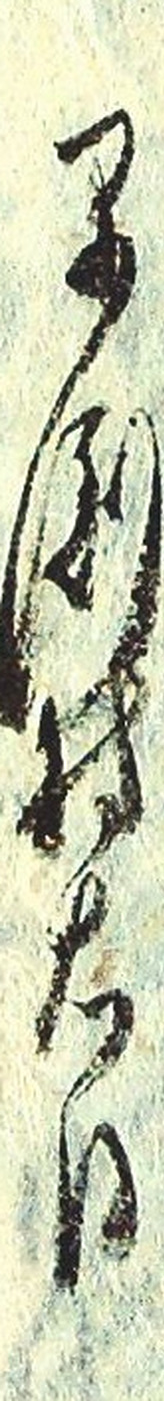早淵村右同
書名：諸御願書控(弐番）
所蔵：鳴門教育大学 Naruto University of Education
